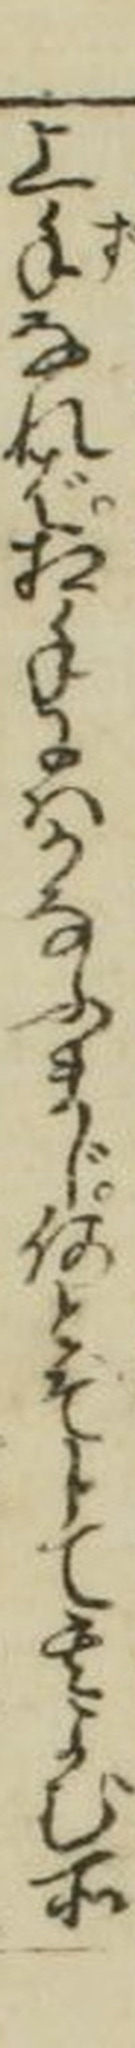上手なれば。相手にはかなふまじ。何とそして其よむ所
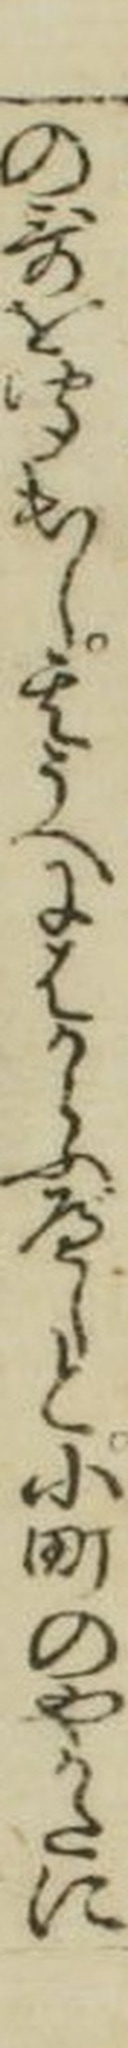の哥を聞出し。其うへにはからふべしと。小町のやかたに
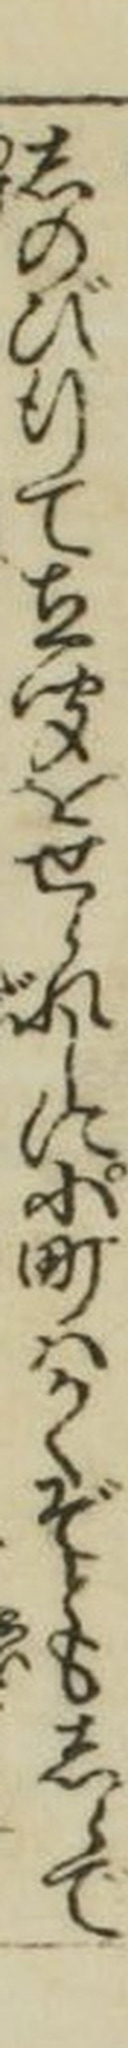しのび行て立聞をせられしに。小町はかくぞともしらで
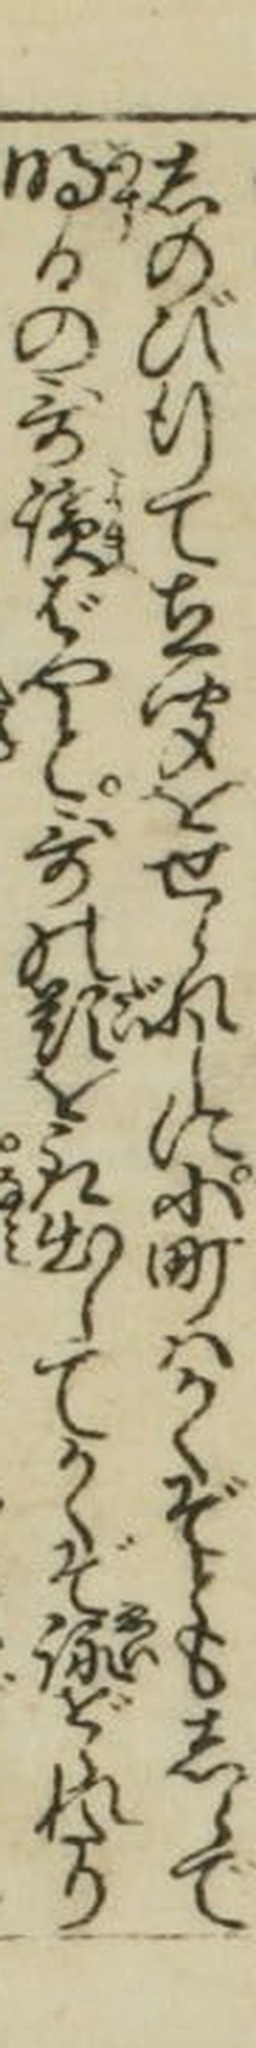明日の哥読ばやと。哥の題を取出してかくぞ詠ぜられたり
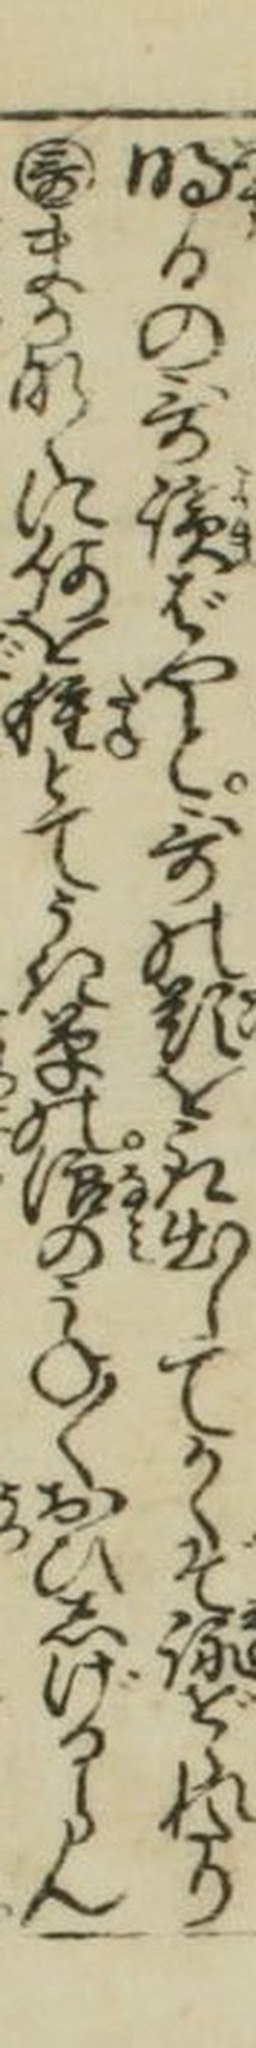哥まかなくに何を種とてうき草の。浪のうね〳〵おひしげるらん
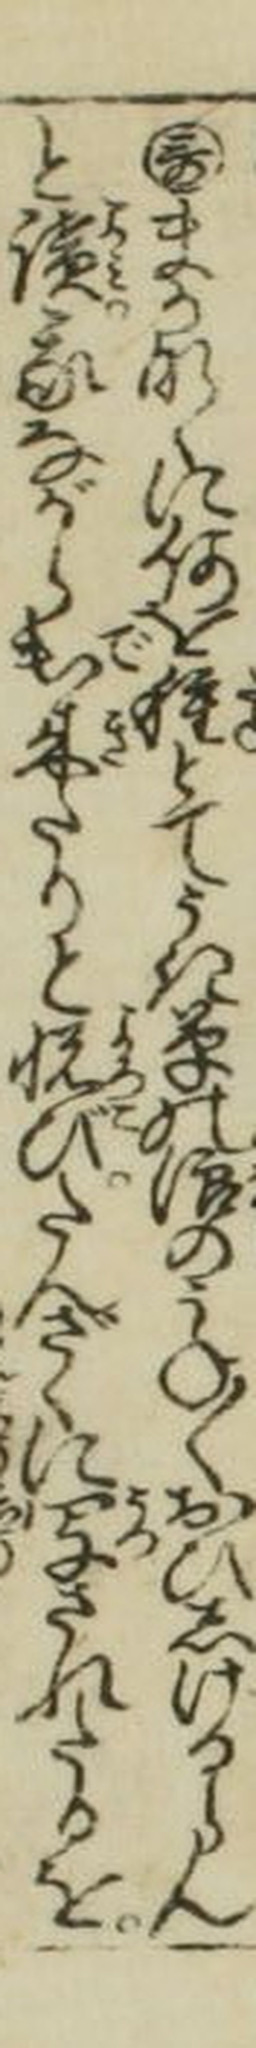と読。我ながら出来たりと悦び。たんざくに写されたるを。
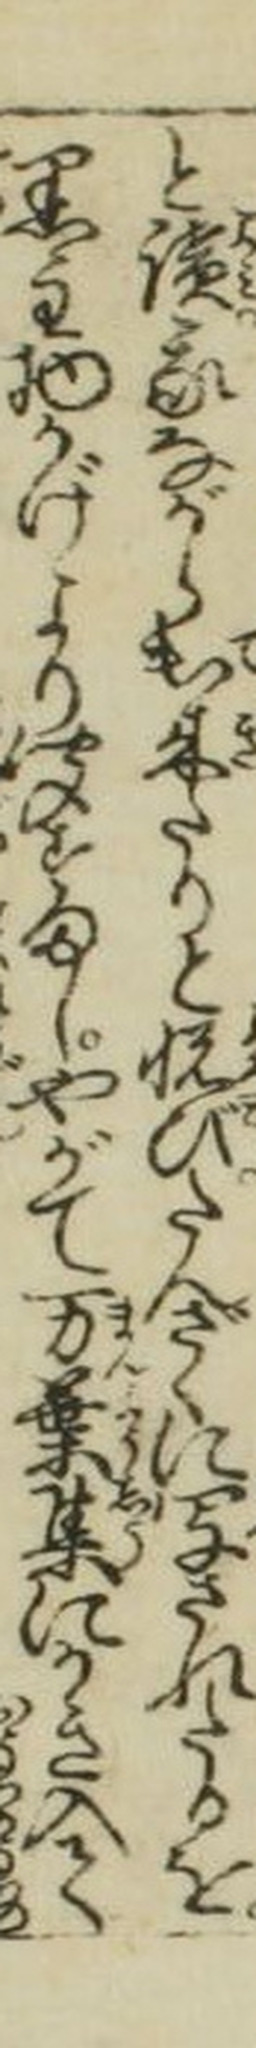黒主物かげより聞すまし。やがて万葉集にかき入て
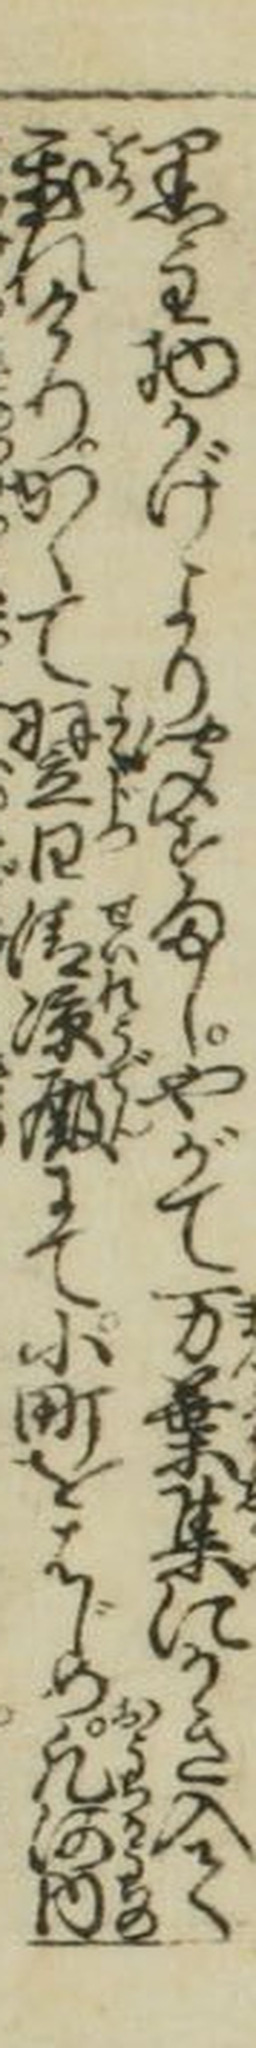置れけり。かくて翌日清涼殿にて小町をはじめ。凡河内
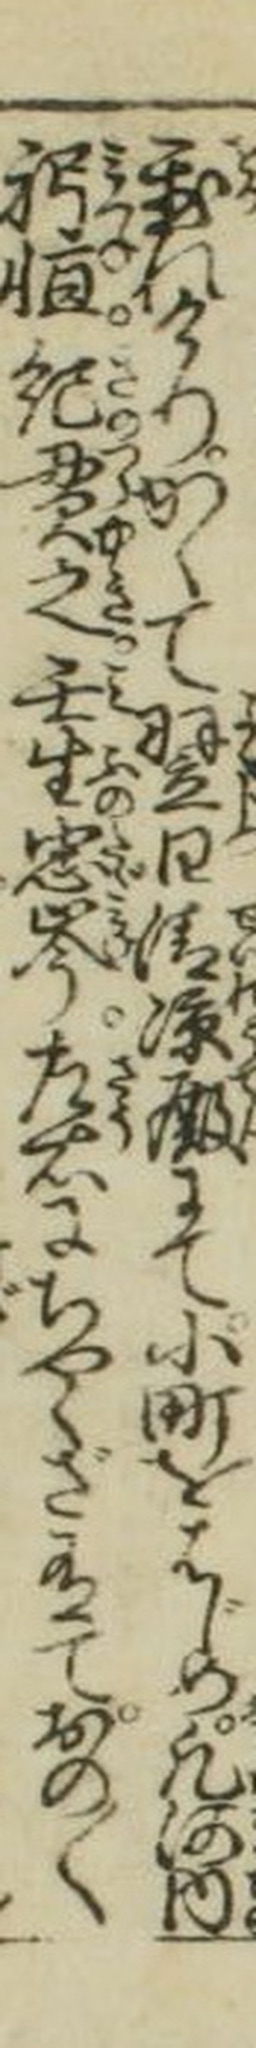躬恒。紀貫之。壬生忠岑。左右にちやくざ有て。おの〳〵
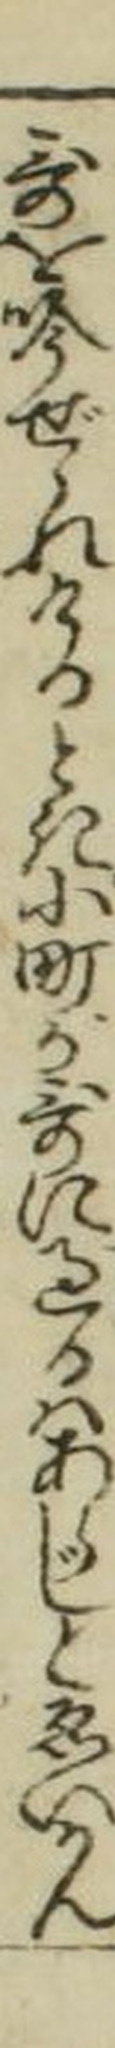哥を吟ぜられけるとき。小町が哥に過るはあらじとゑいかん
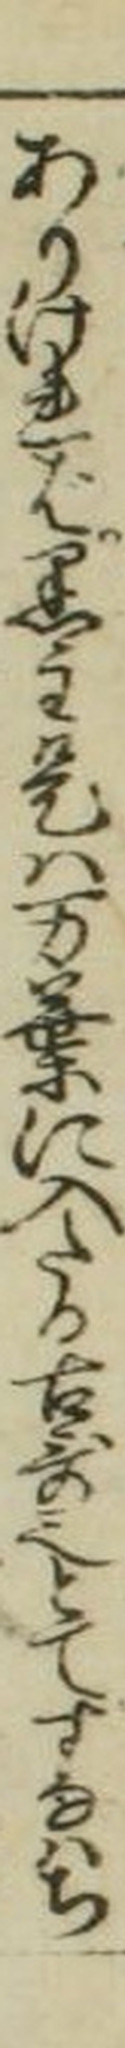ありければ。黒主是は万葉に入たる古哥也とて。すなはち
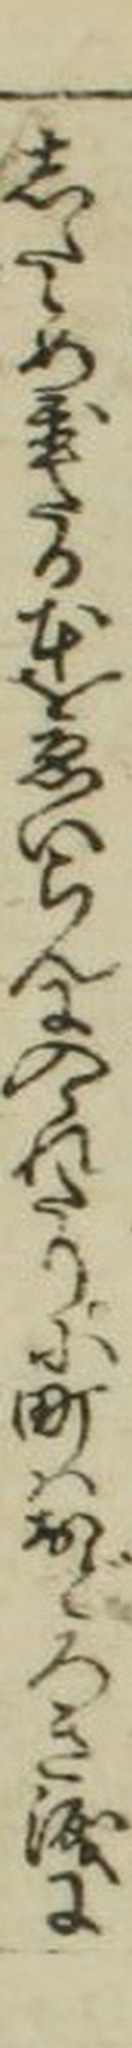したゝめか書たる本をゑいらんに入られたり。小町はおどろき涙に
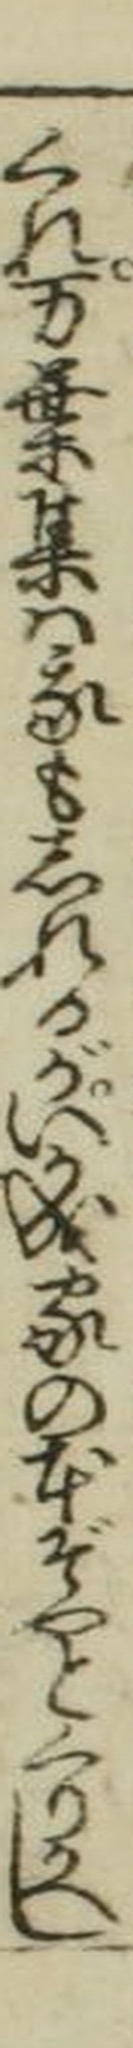くれ。万葉集は我もしれるが。いか成家の本ぞやとくりかへし
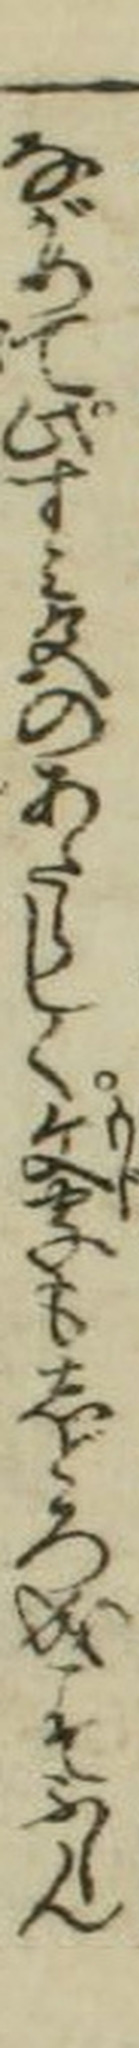ながめて。此すみ色のあたらしく。文字もしどろ成こそふしん
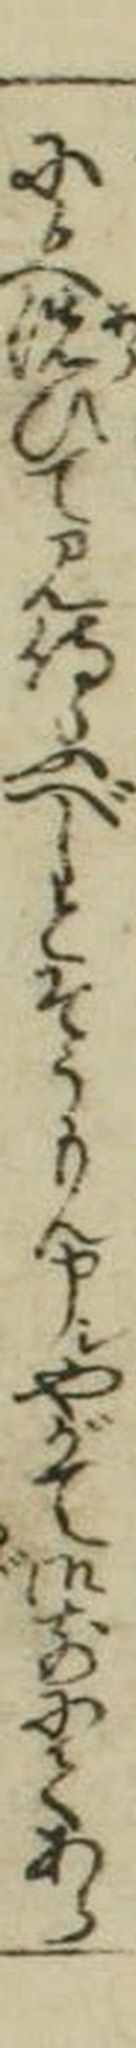に候へ洗ひて見侍候ふべしとそうもん申やがて御前にてあら
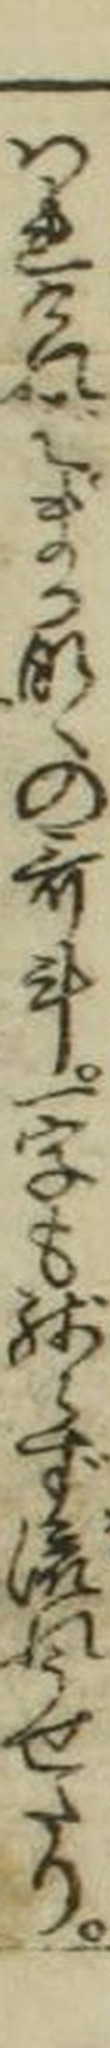はれければまかなくの哥斗。一字も残らず流れうせたり。
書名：女源氏教訓鑑
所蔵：東京学芸大学附属図書館
